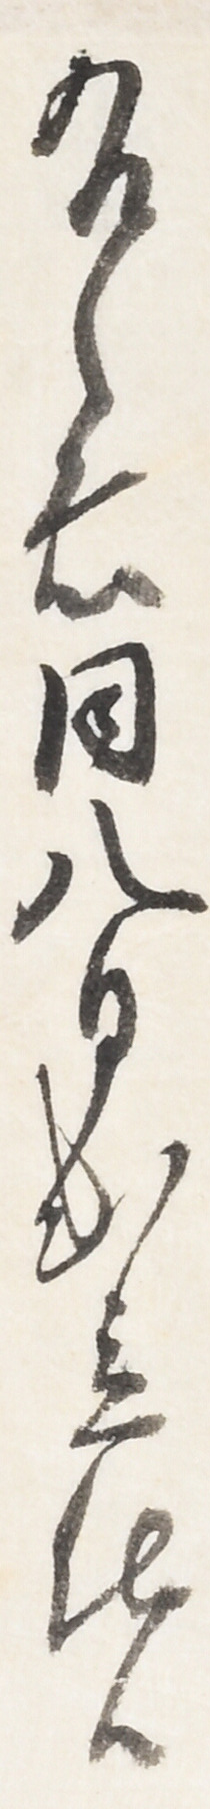右之者同八日出立仕候
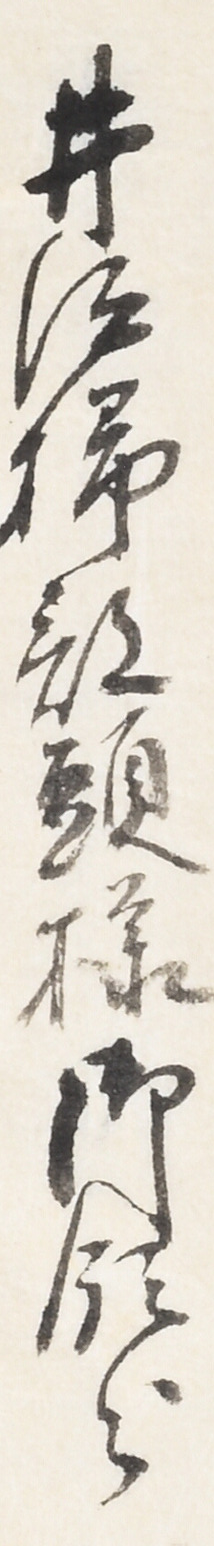井伊掃部頭様御領分
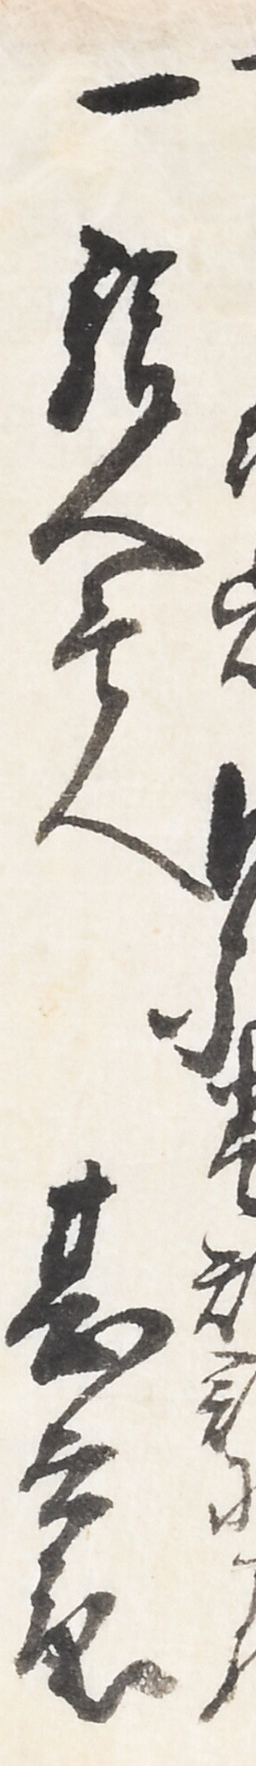一旅人壱人甚兵衛
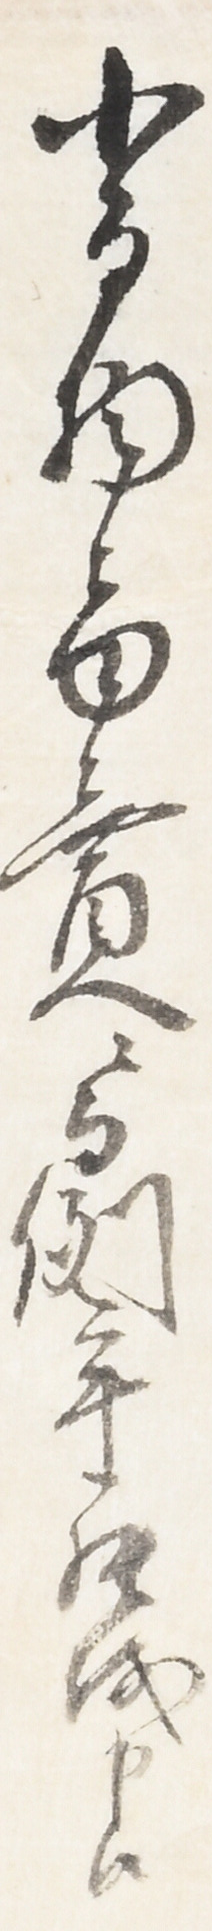小間物商売ニ而例年罷越申候
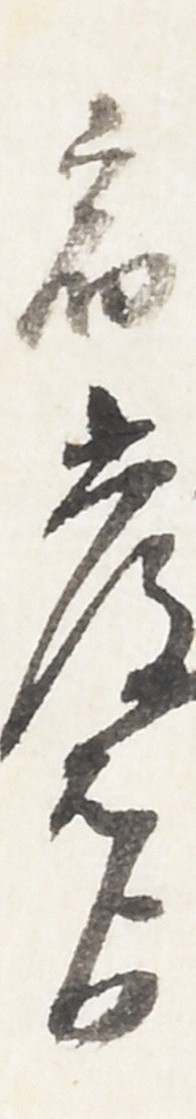宿常右衛門
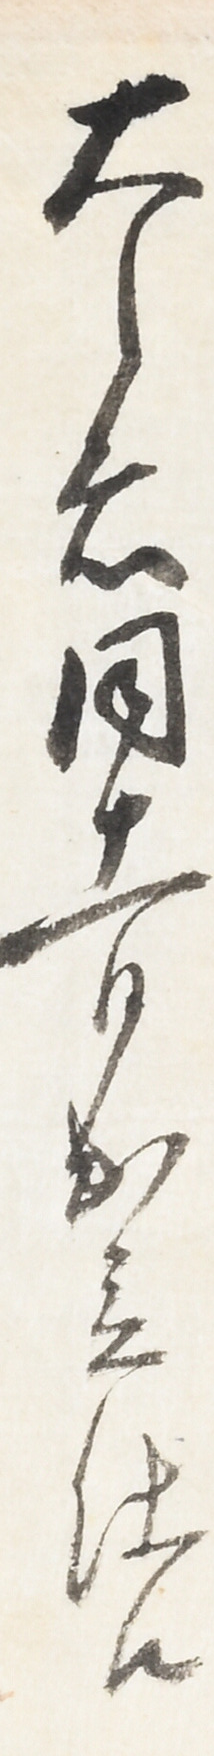右之者同十一日出立仕候
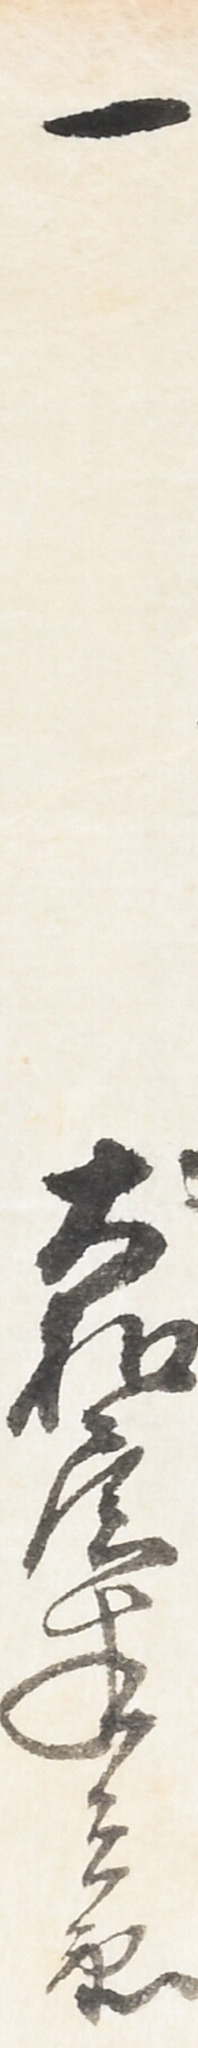一大和屋半兵衛
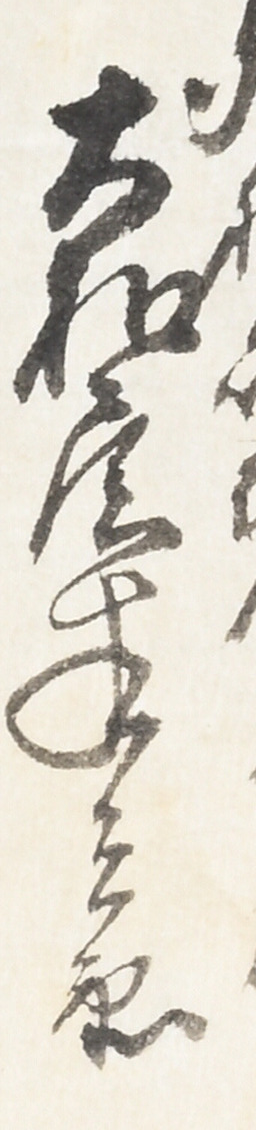一大和屋半兵衛
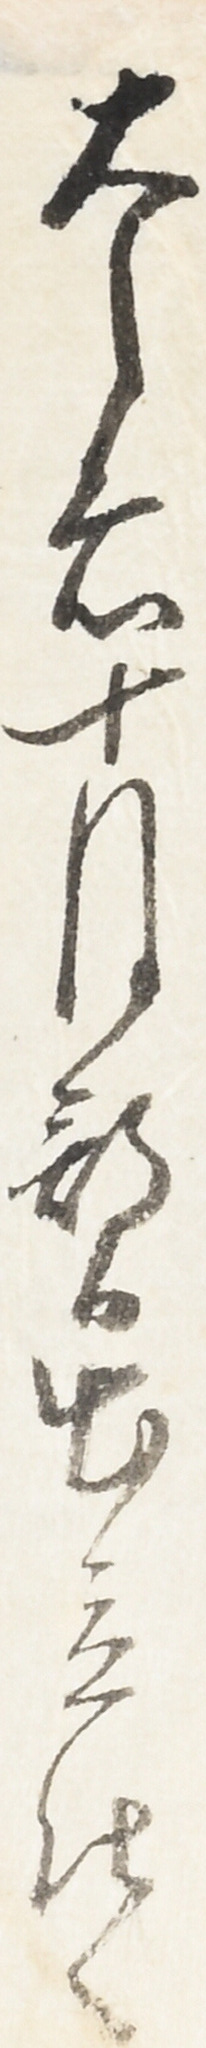右之者十月朔日出立仕候
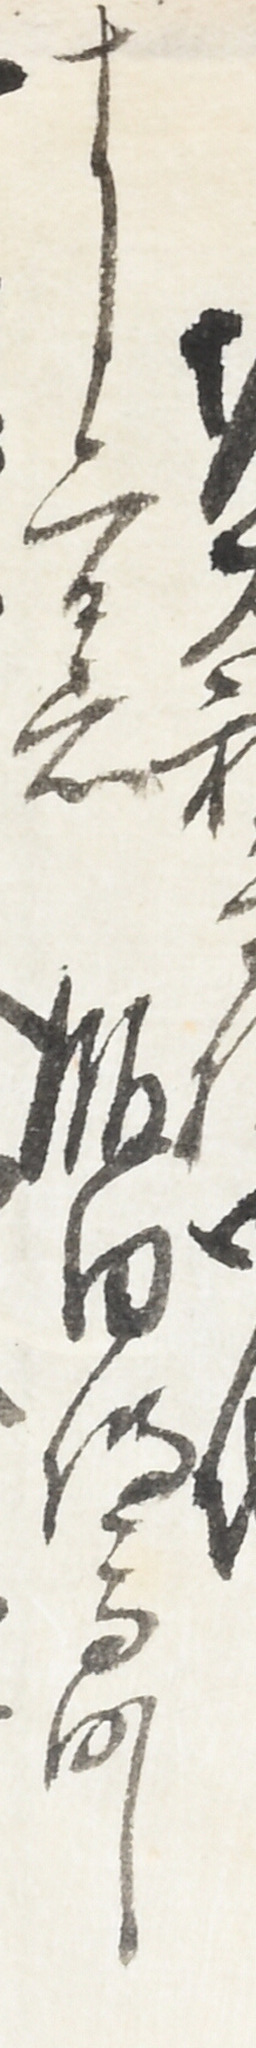十月二日着飯田伝馬町
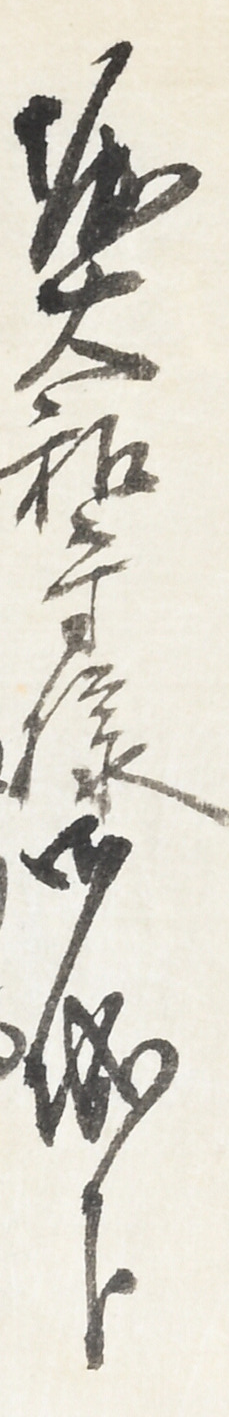堀大和守様御城下
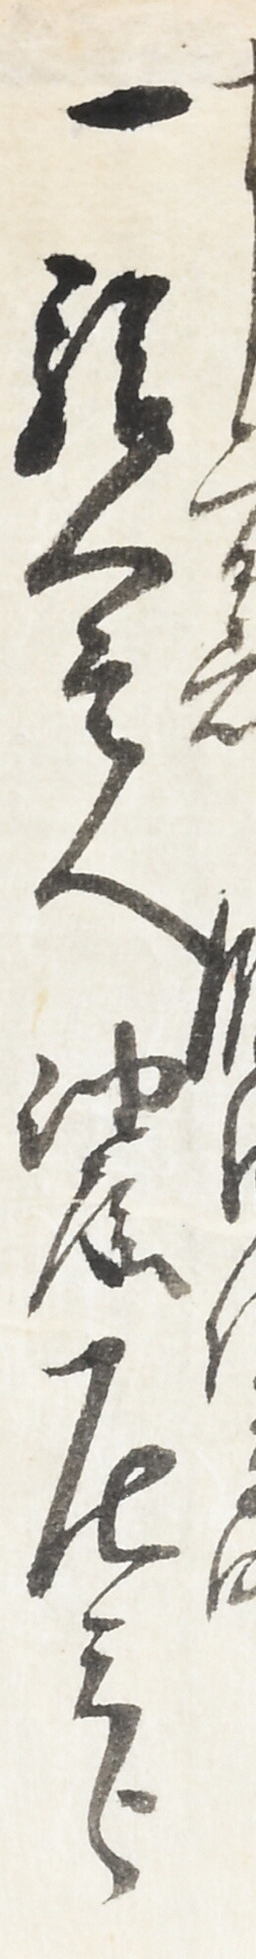一旅人壱人油屋庄三郎
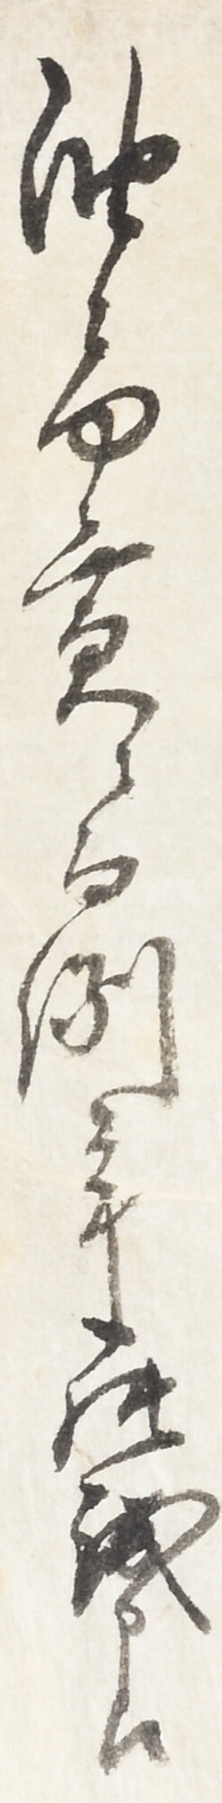油商売ニ而例年罷越申候

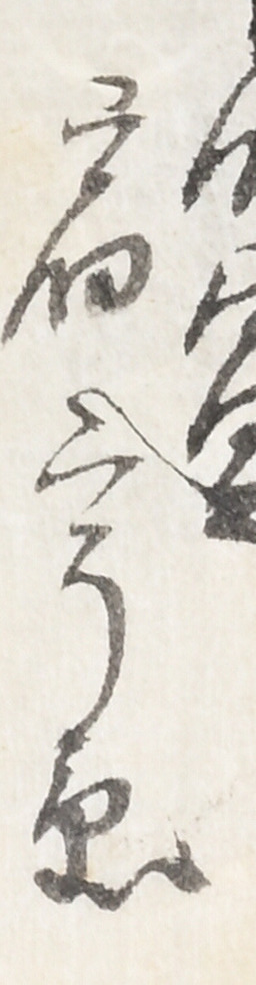宿久兵衛
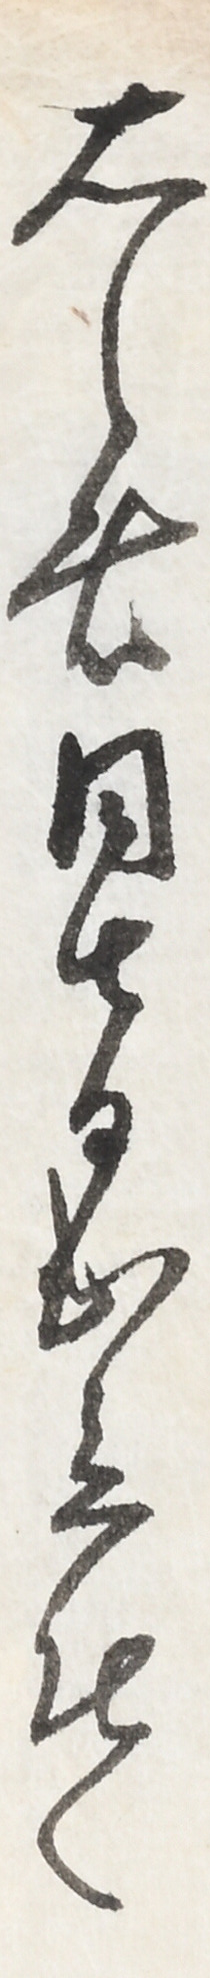右之者同七日出立仕候
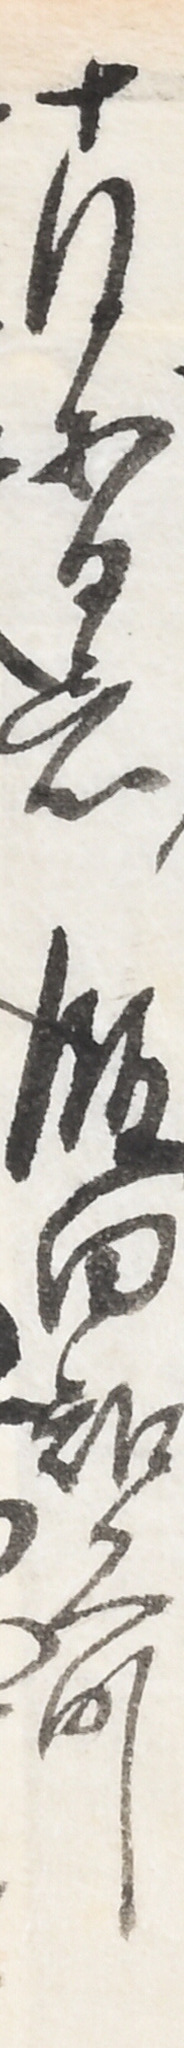十月五日着飯田知久町
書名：旅人泊控帳
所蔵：伊那市立高遠町図書館・合同会社AMANE
